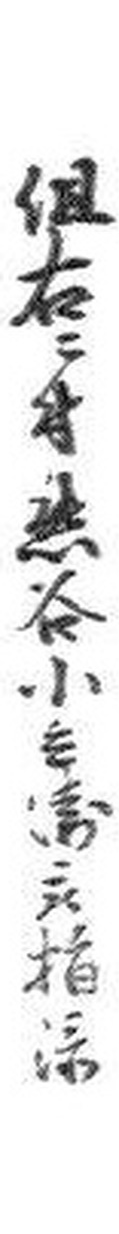但右ニ付熊谷小兵衛被指添
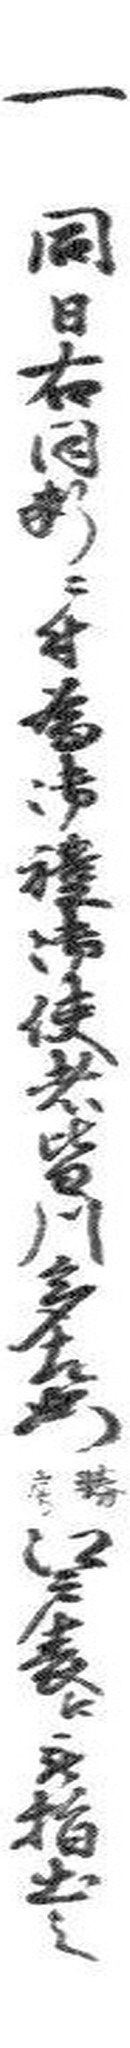一同日右同断ニ付為御礼御使者皆川多左衛門勝房江戸表江被指出之
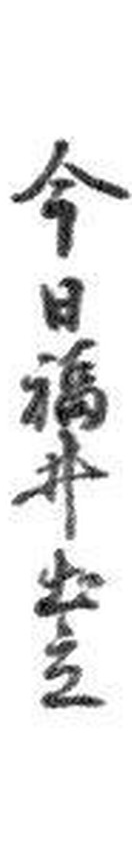今日福井出立
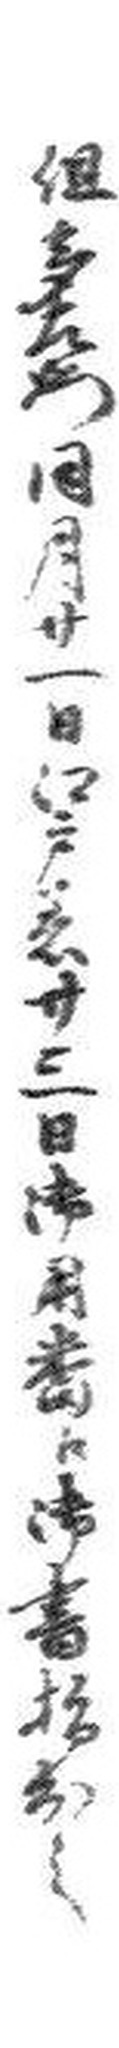但多左衛門同月廿一日江戸着廿三日御用番江御書指出之
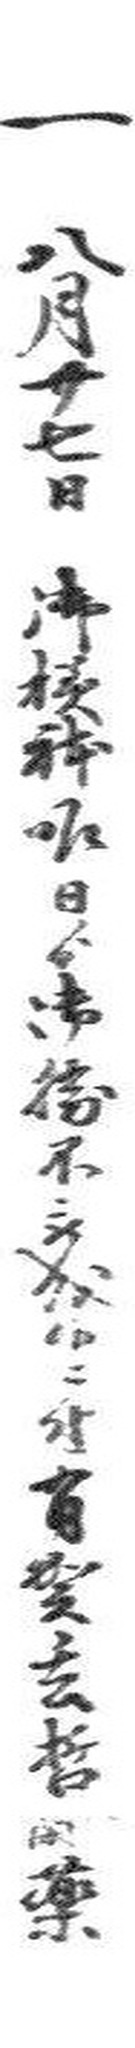一八月廿七日御様体昨日ゟ御勝不被成候ニ付有賀玄哲一閑薬
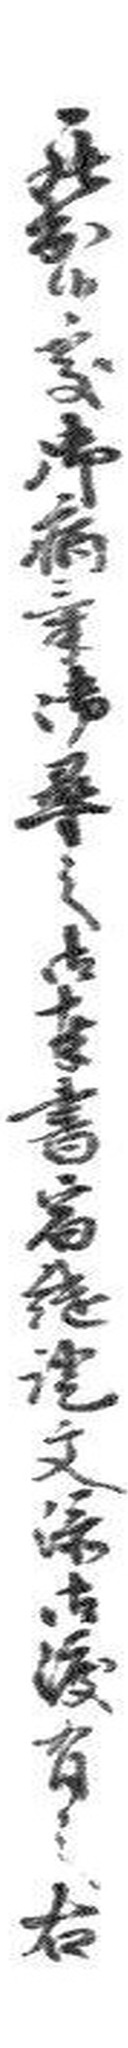罷出候処御病気御尋之御奉書宿継証文添御渡有之右

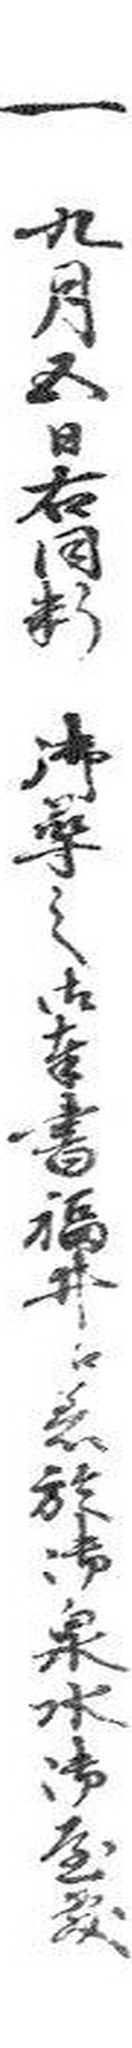一九月五日右同断御尋之御奉書福井江着於御泉水御屋敷
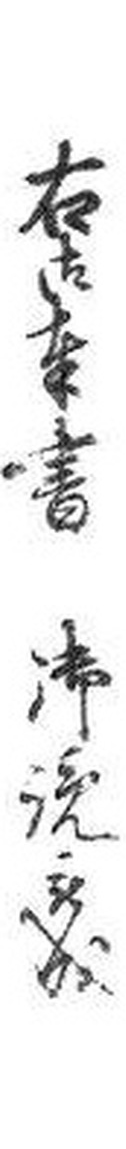右御奉書御覧被成
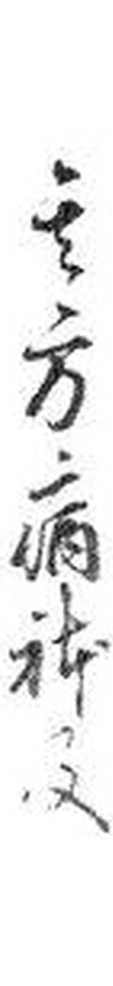其方病体及
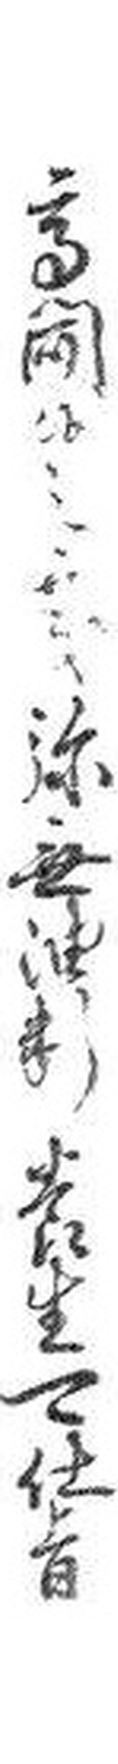高聞候之処弥無油断養生可仕旨
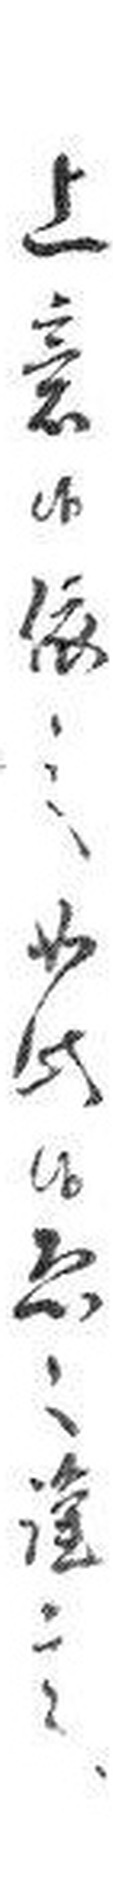上意候依之如此候恐々謹言
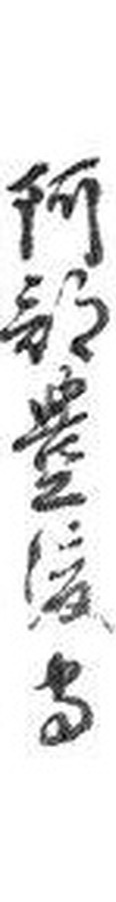阿部豊後守
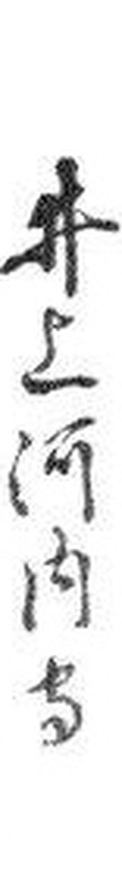井上河内守
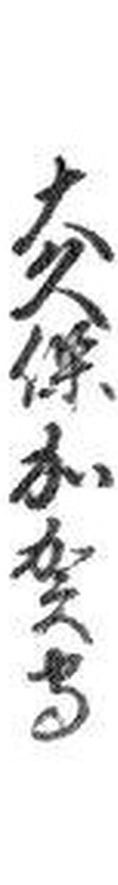大久保加賀守
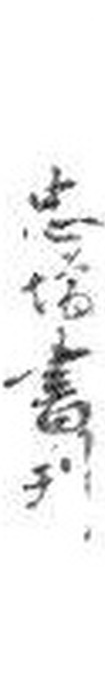忠増書判
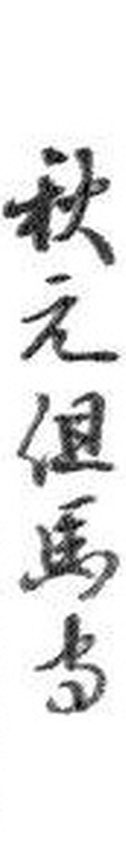秋元但馬守
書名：家譜 二十六 吉品公 従宝永七年到正徳二年
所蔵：福井県文書館 Fukui Prefectural Archives
